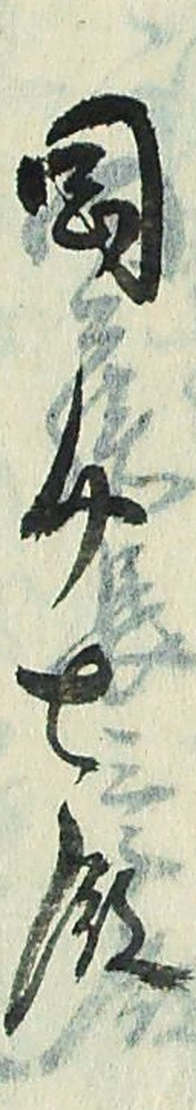岡介七殿
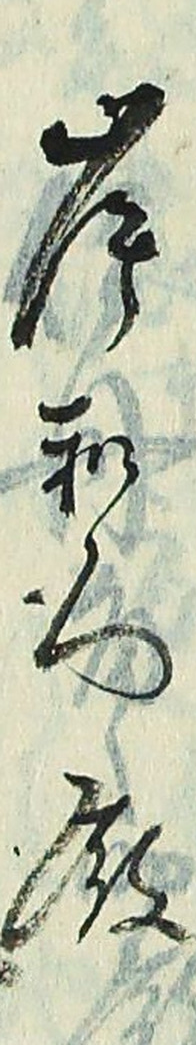岸和左衛門殿
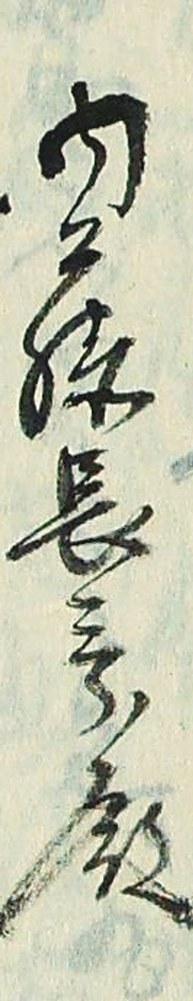内藤長三郎殿
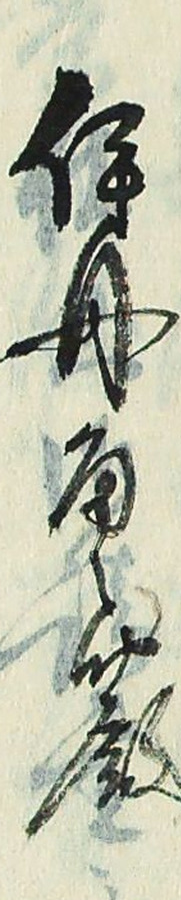伊丹角之助殿
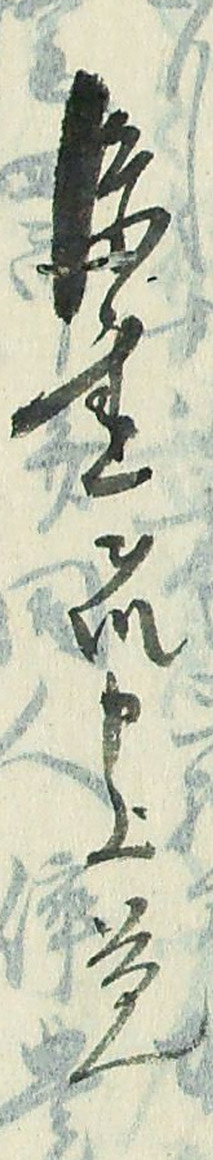添書を以申上覚

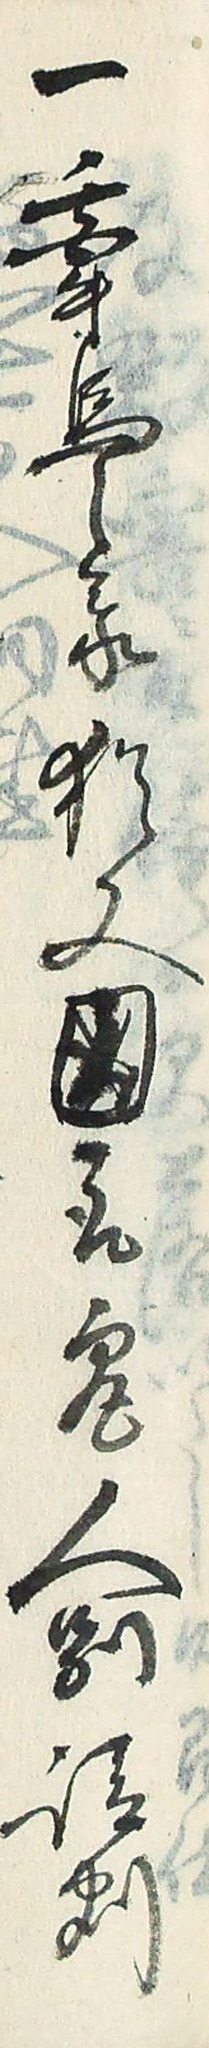一牽馬之義猶又取究人別請判
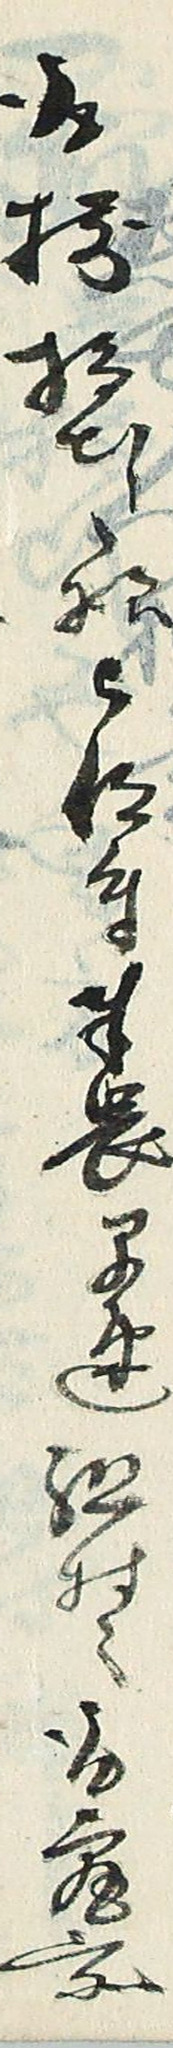取揃指出し候様被仰付奉畏早速組村々取究候所
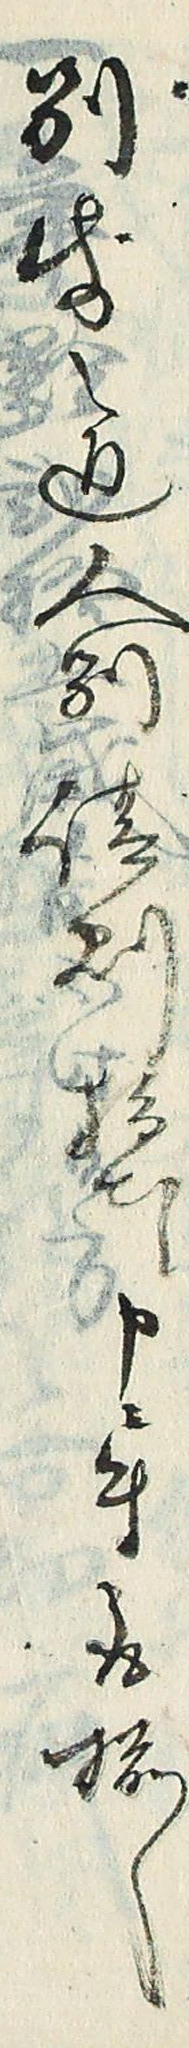別帋之通人別請判指出申に付取揃へ
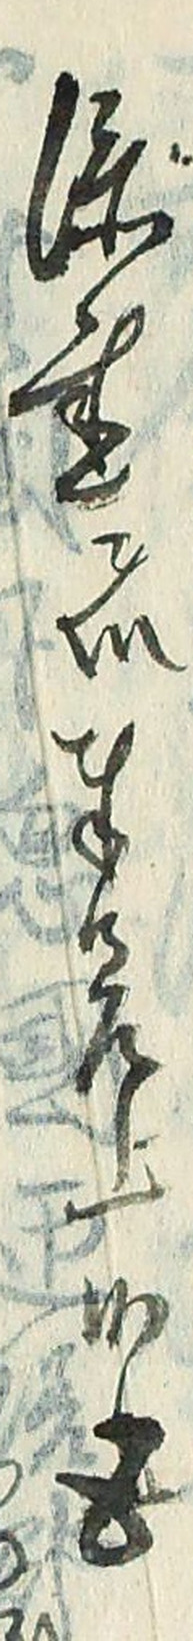添書を以奉差上候以上
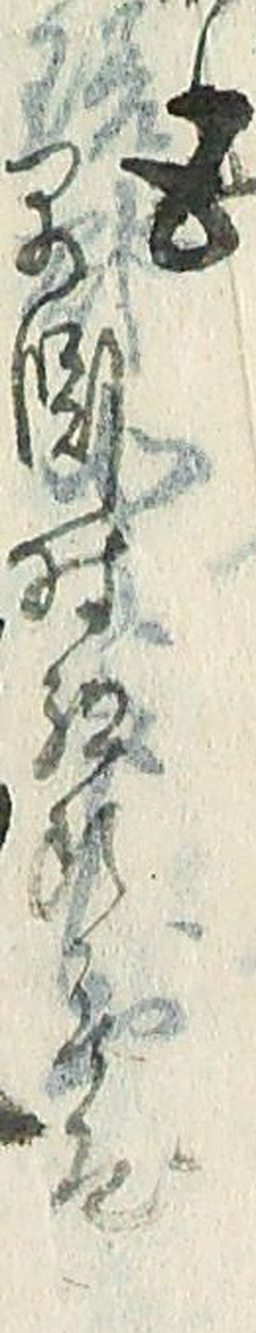早淵村組頭庄屋
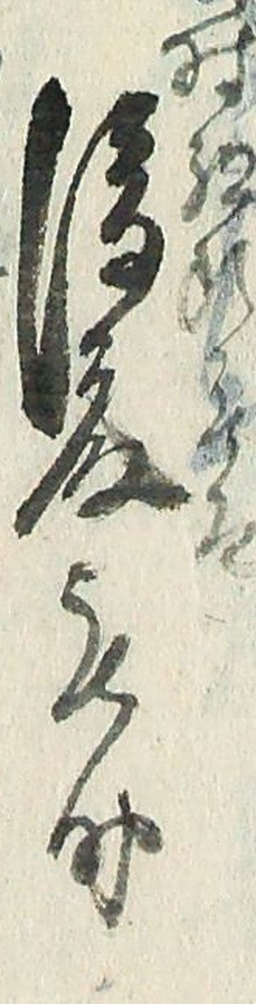後藤庄助
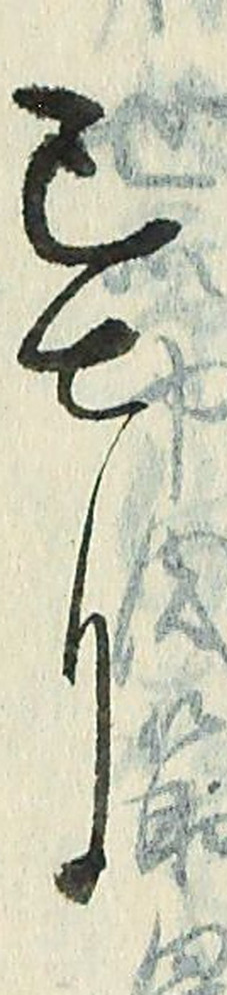巳七月
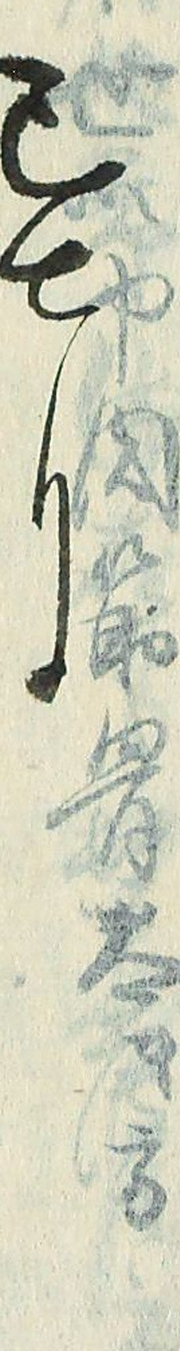巳七月
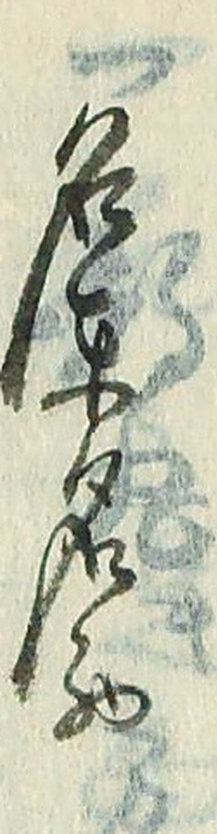名東名西
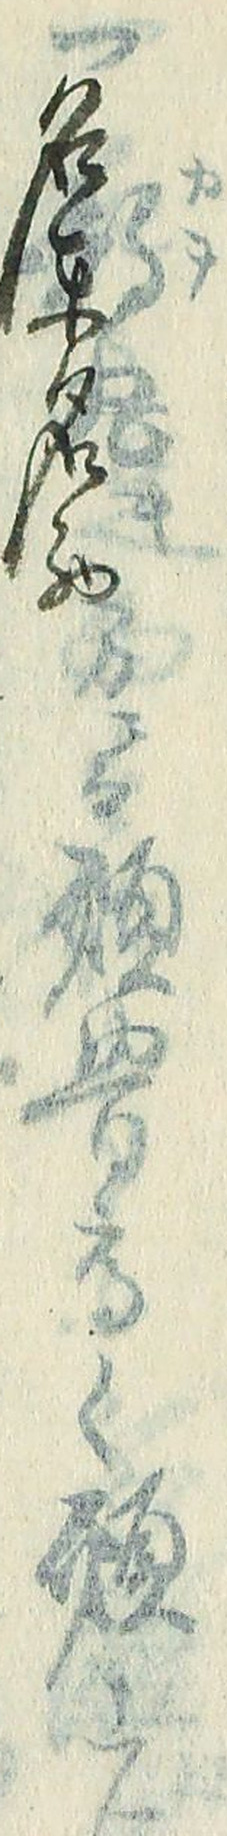名東名西
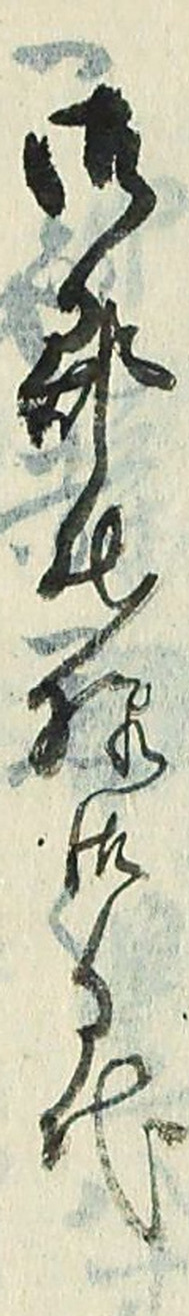御郡代様御手代
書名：諸御用御□受書控
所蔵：鳴門教育大学 Naruto University of Education
